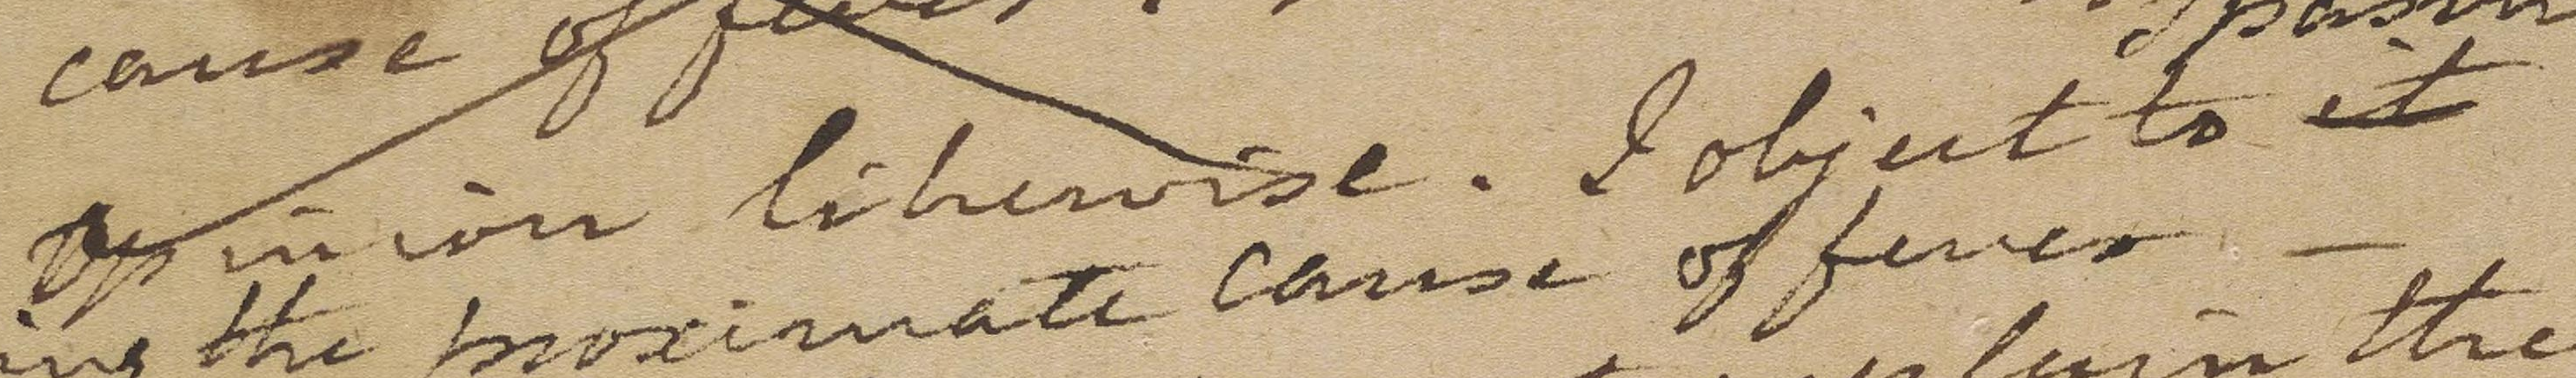Opinion likewise. I object to it ^spasm
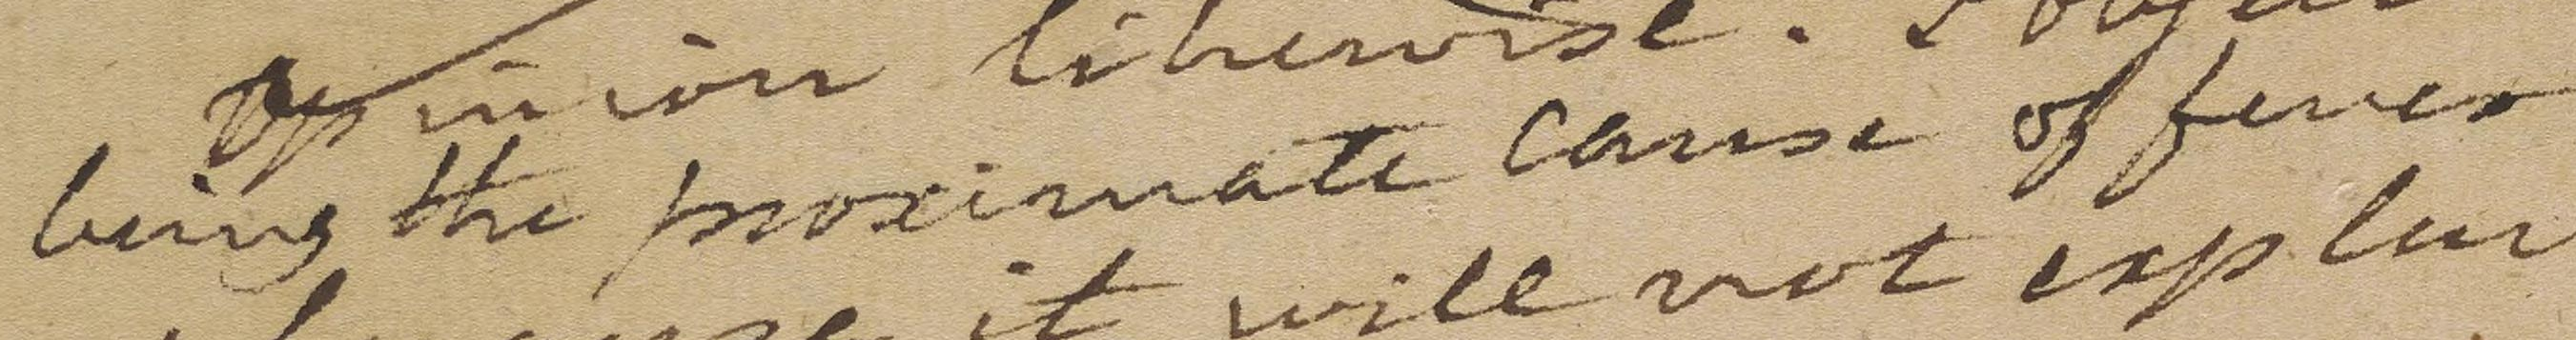being the proximate cause of fever
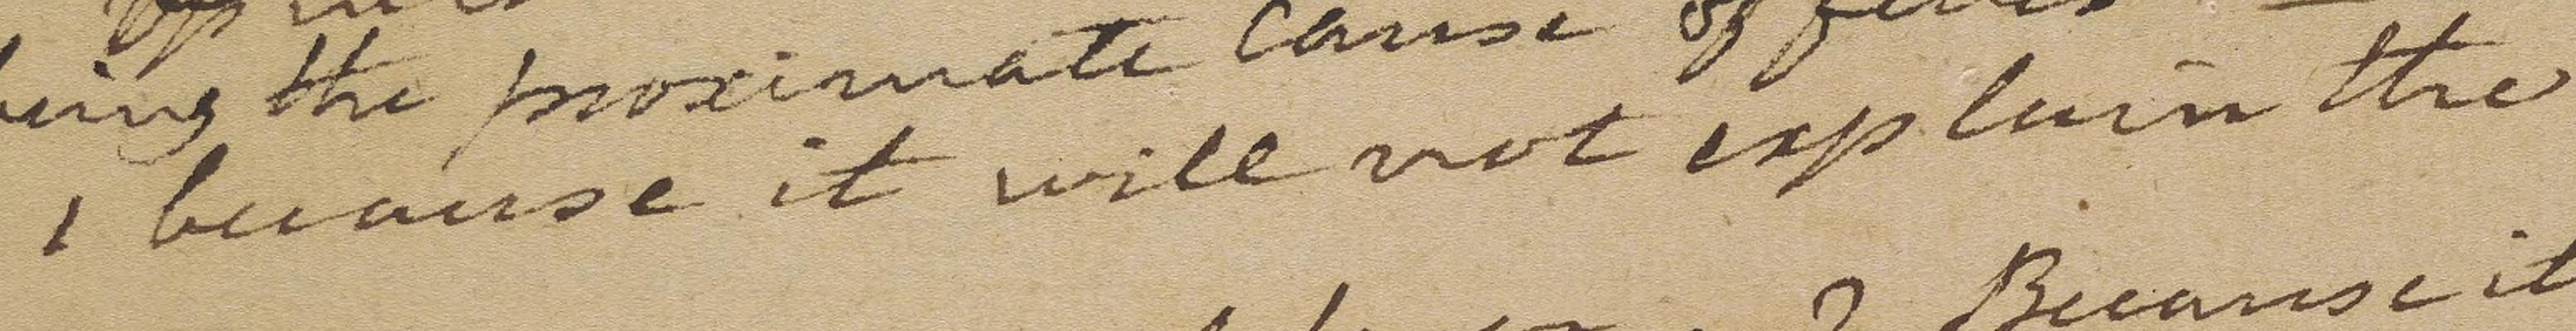1 because it will not explain the
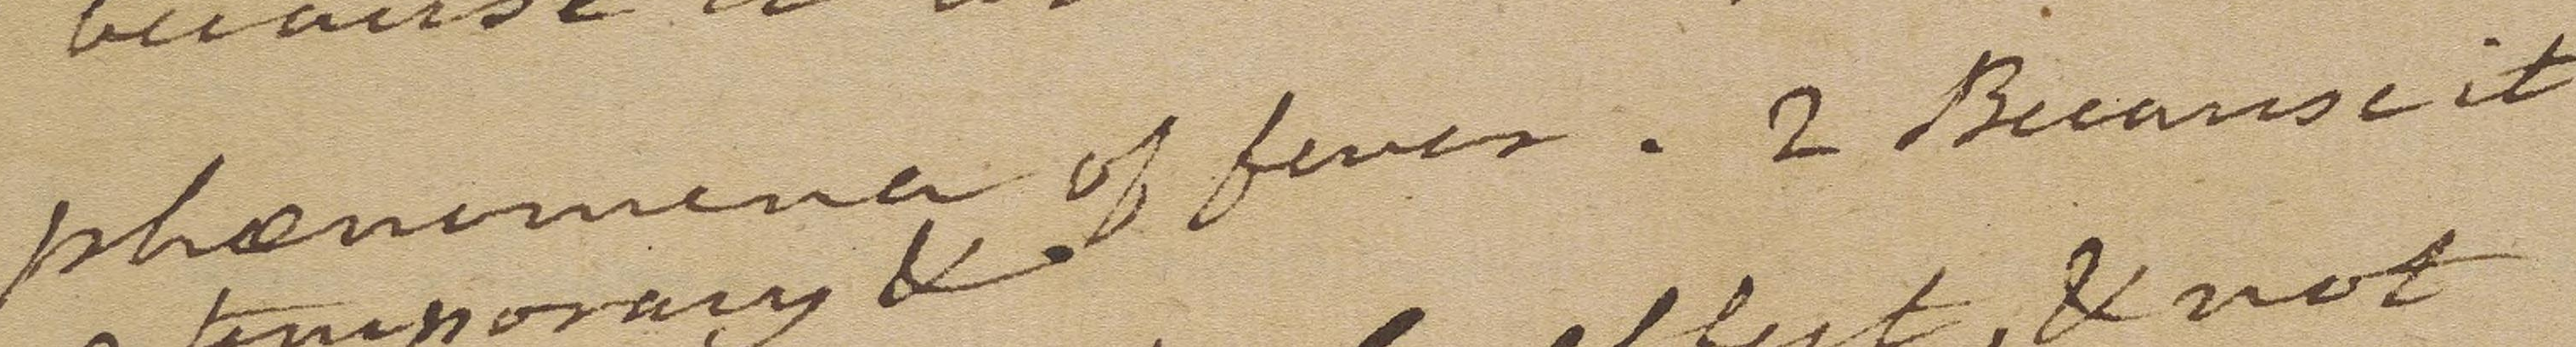phenomena of fever. 2 Because it
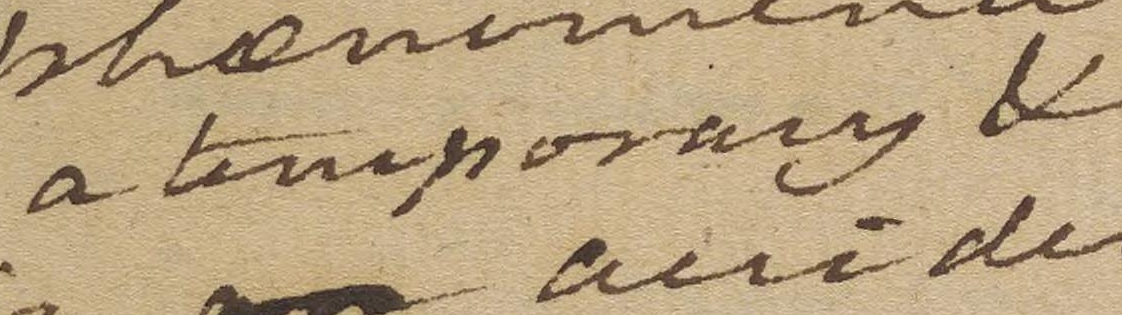a temporary &
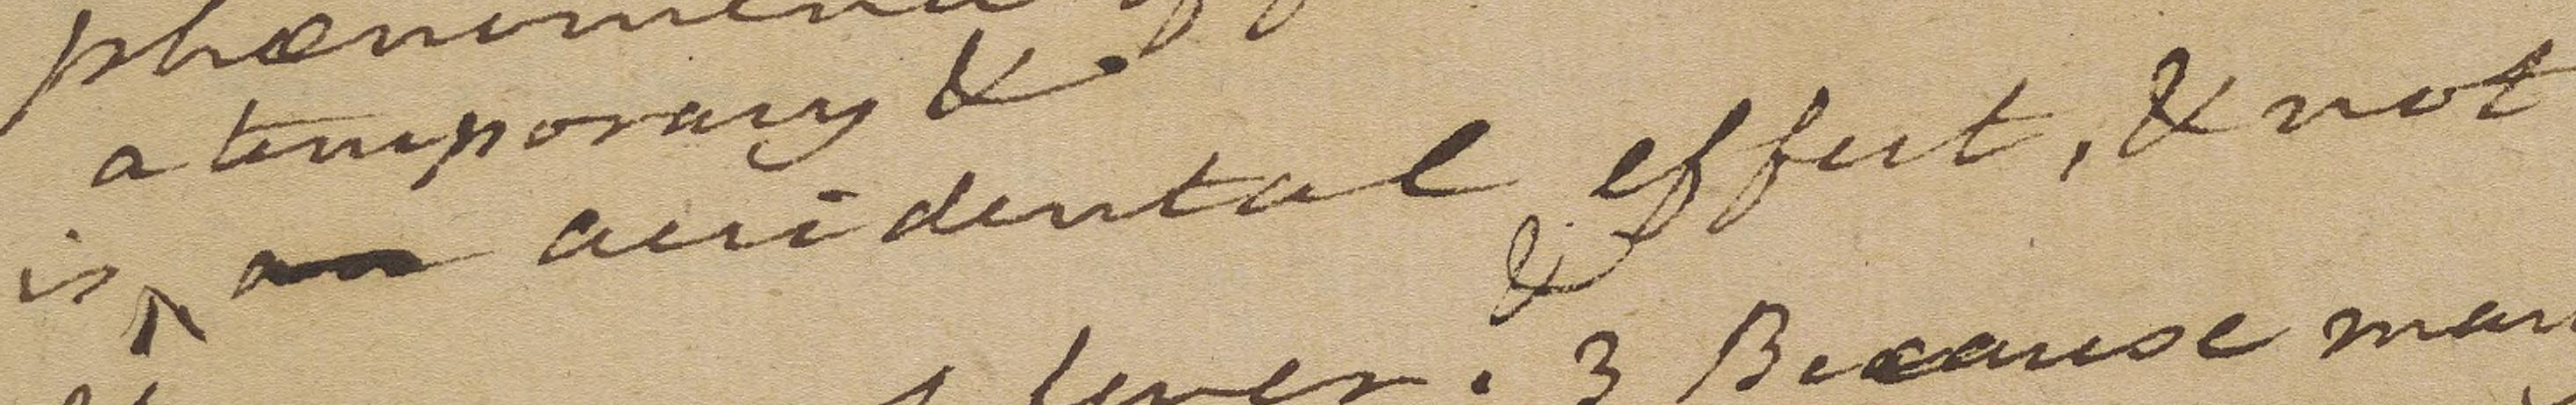is ^ accidental effect, & not
